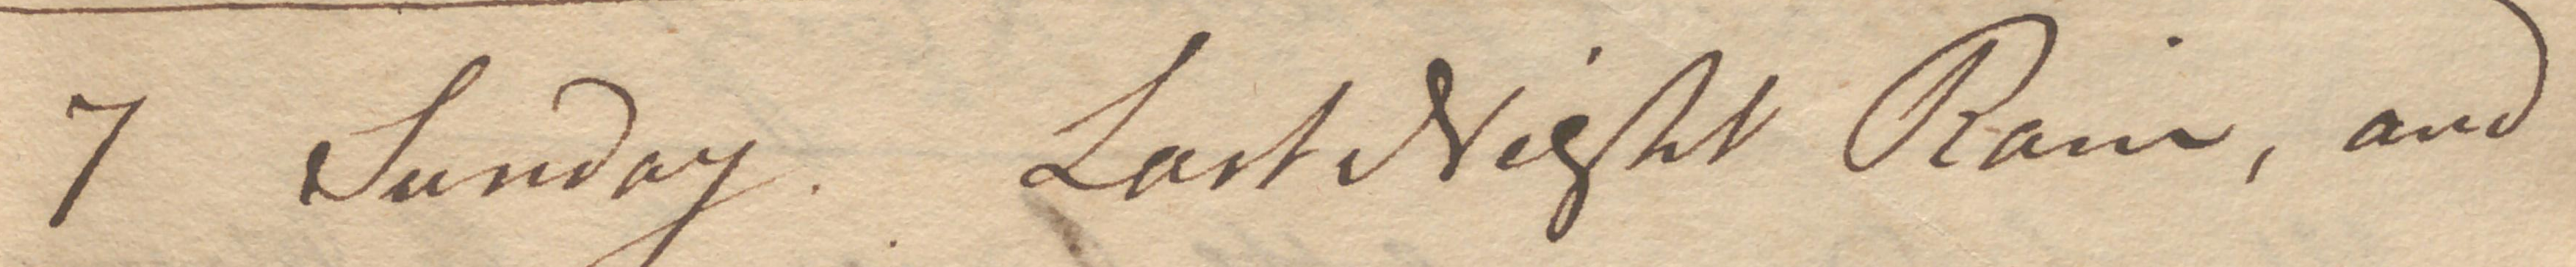7 Sunday. Last Night Rain, and
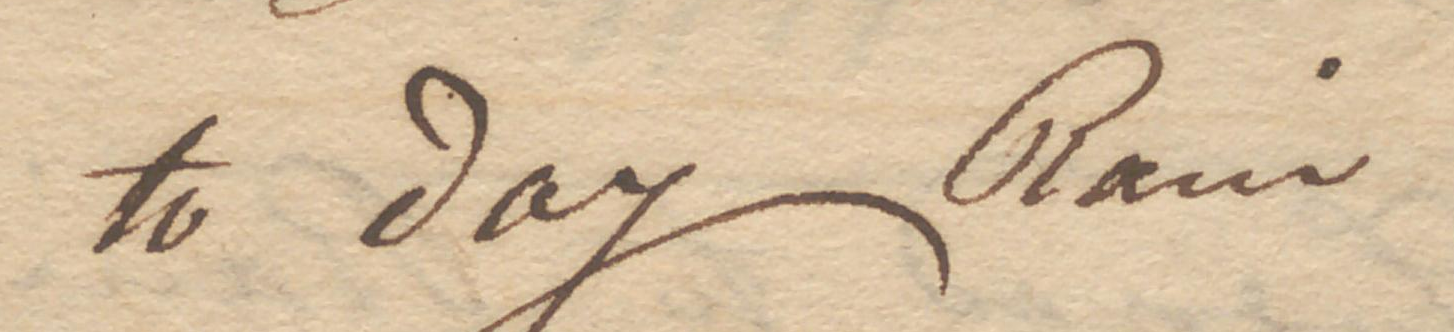to day Rain
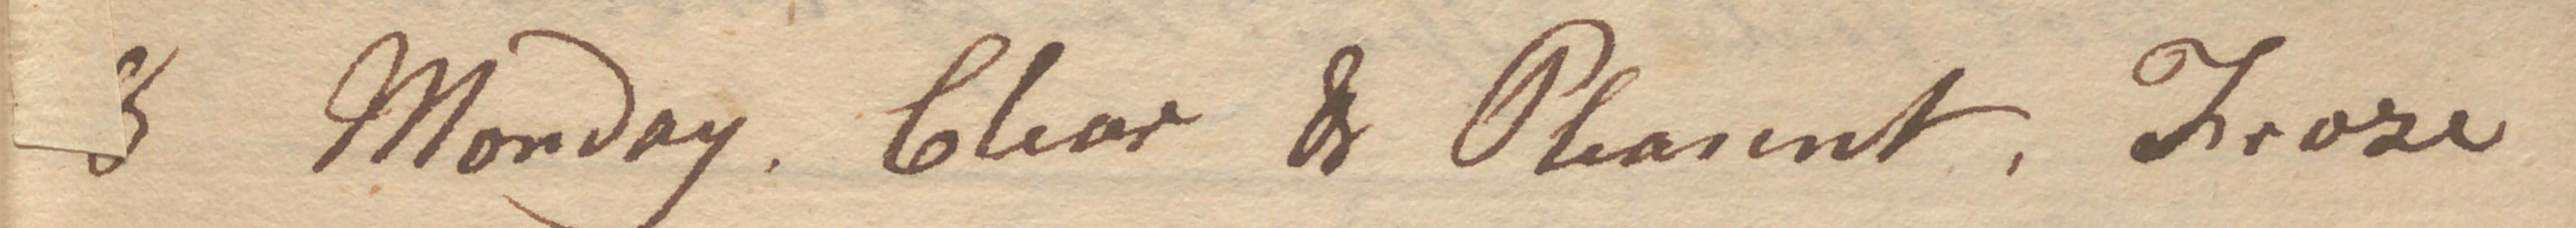3 Monday. Clear & Pleasent, Froze
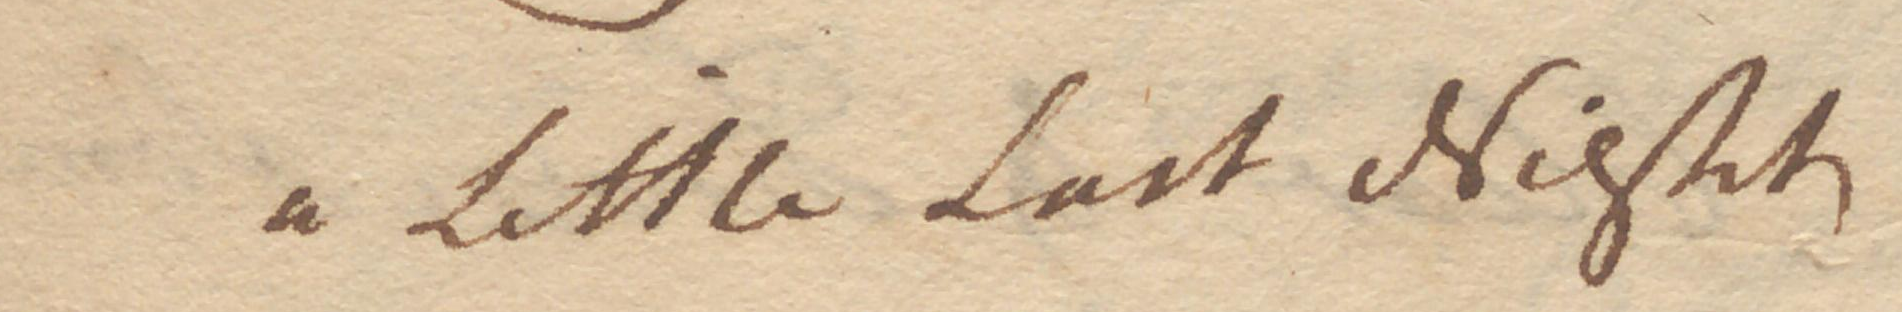a Little Last Night
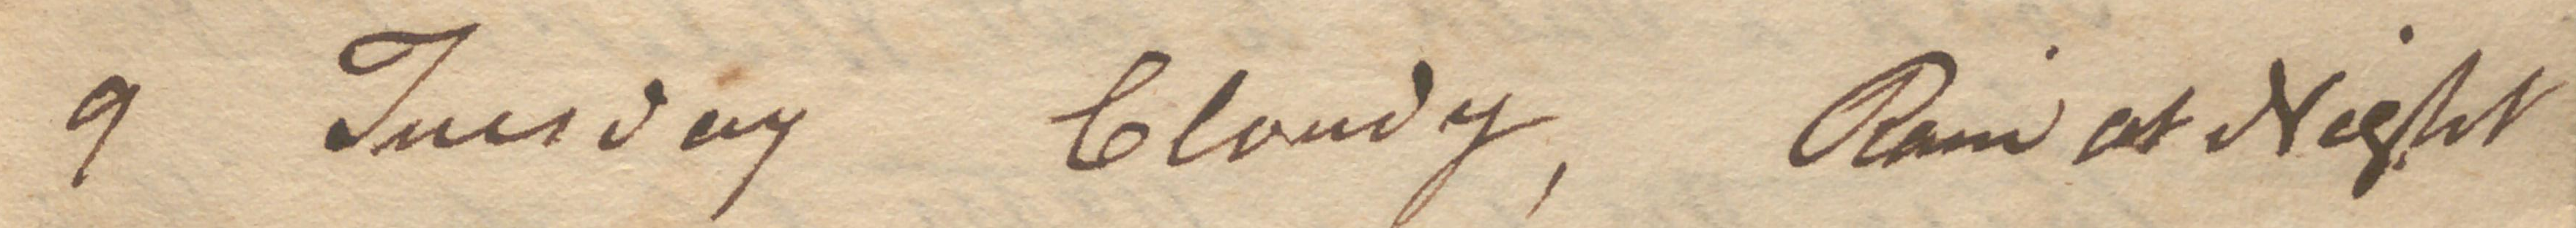9 Tuesday Cloudy, Rain at Night
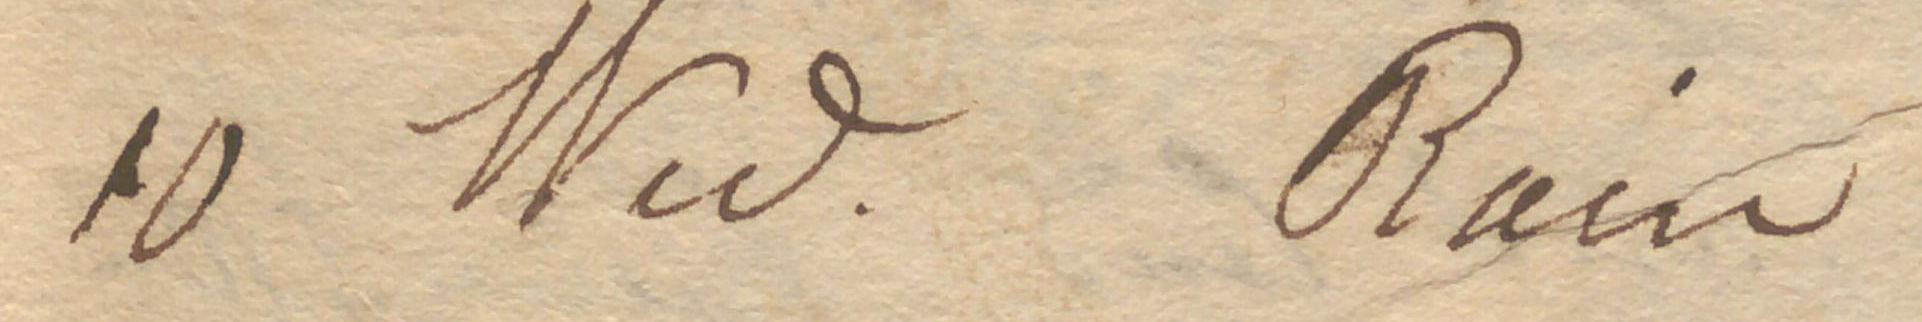10 Wed. Rain
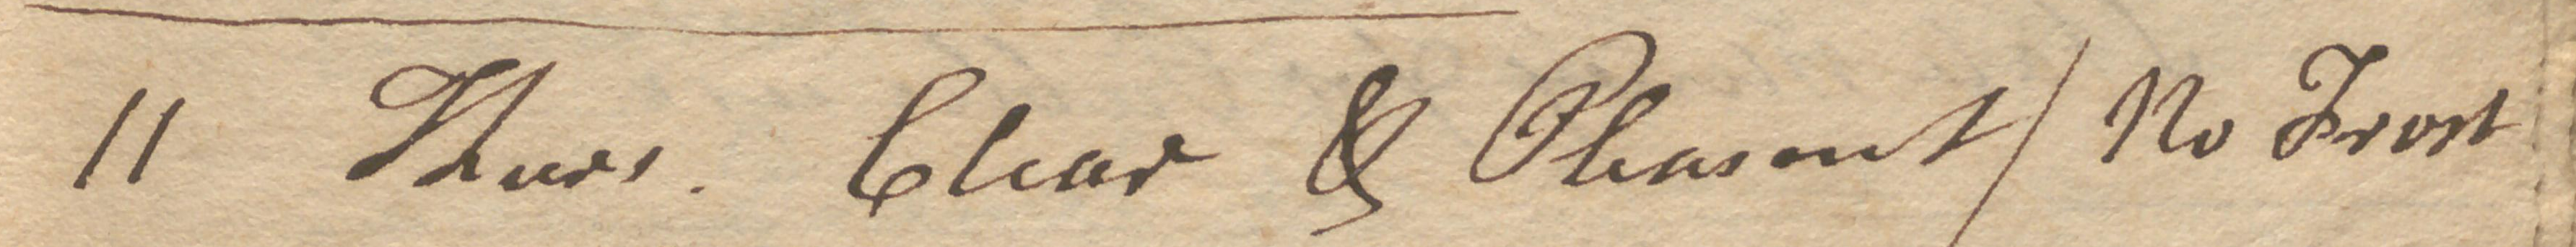11 Thurs. Clear & Pleasent/ No Frost
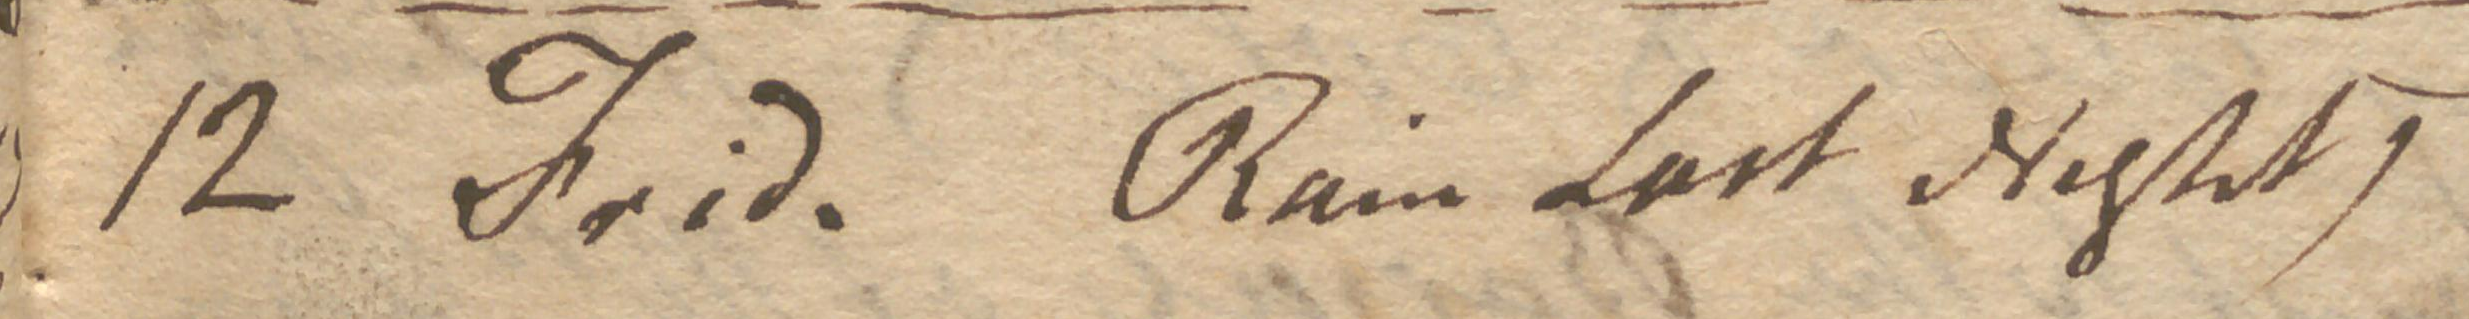12 Frid. Rain Last Night
